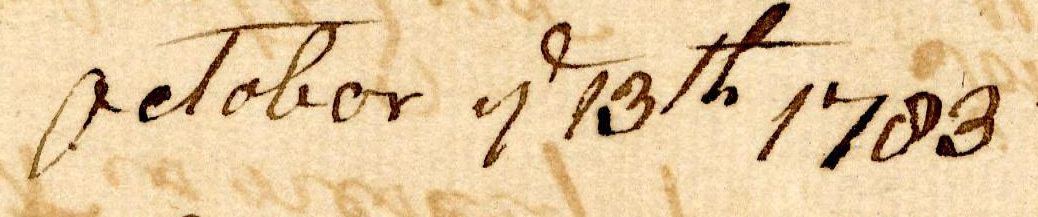October y^e 13^th 1783
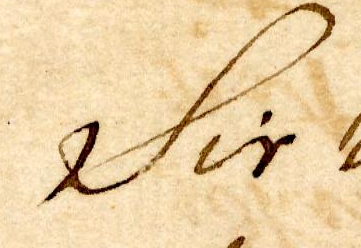Sir
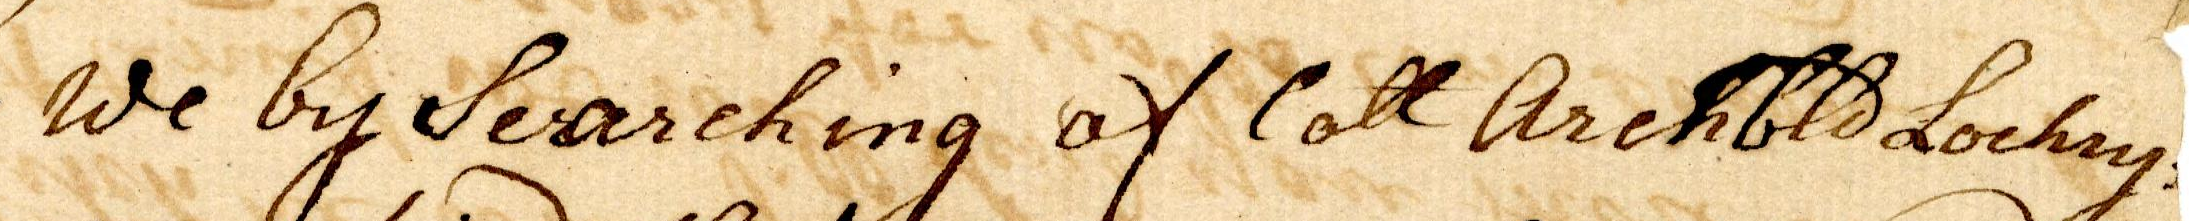We by Searching of Coll Archbld Lochrys
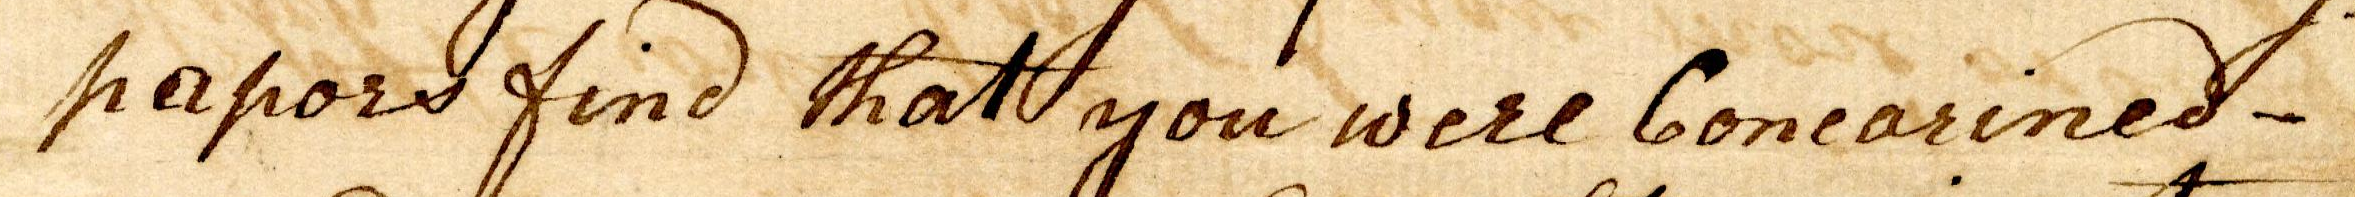papors find that you were Concarined
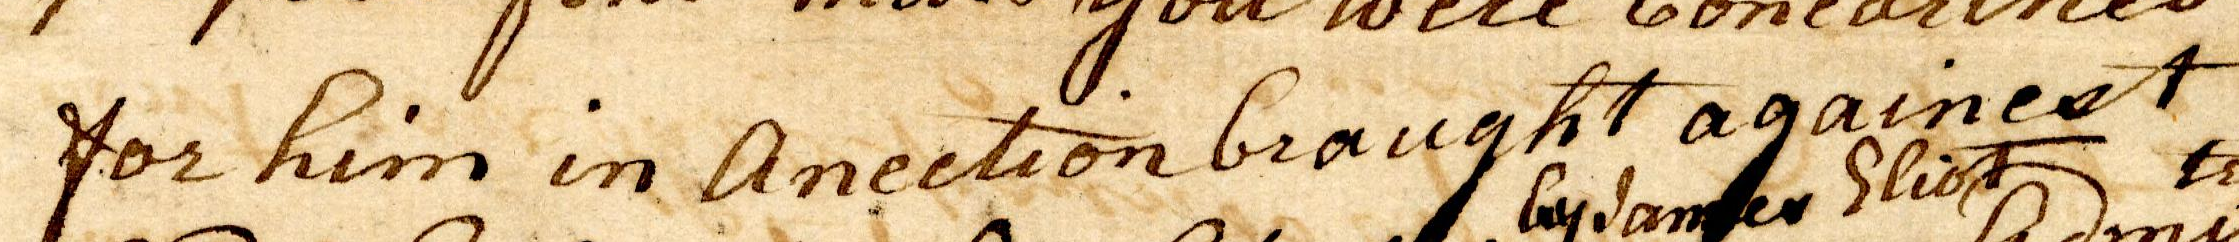for him in Anection braught againest
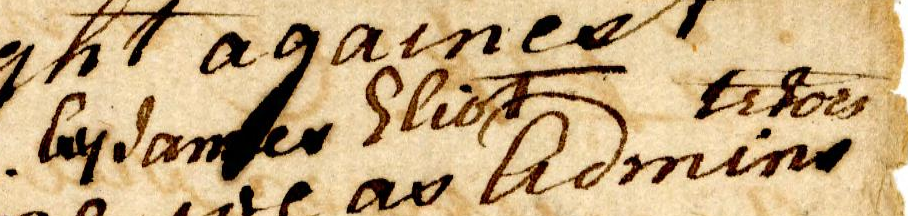by James Eliot tetors
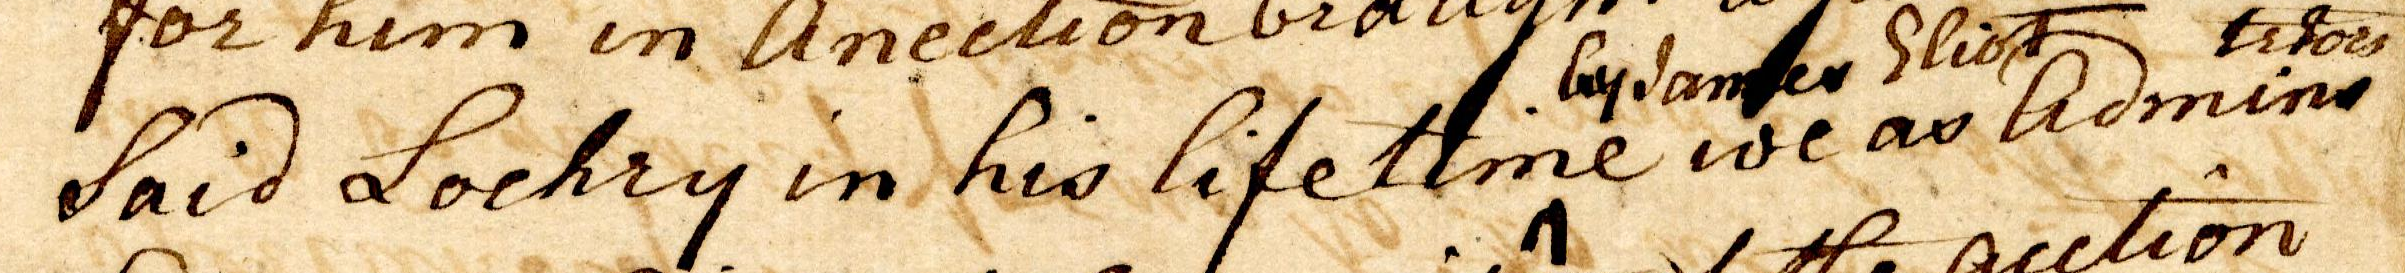said Lochry in his lifetime we as Admins
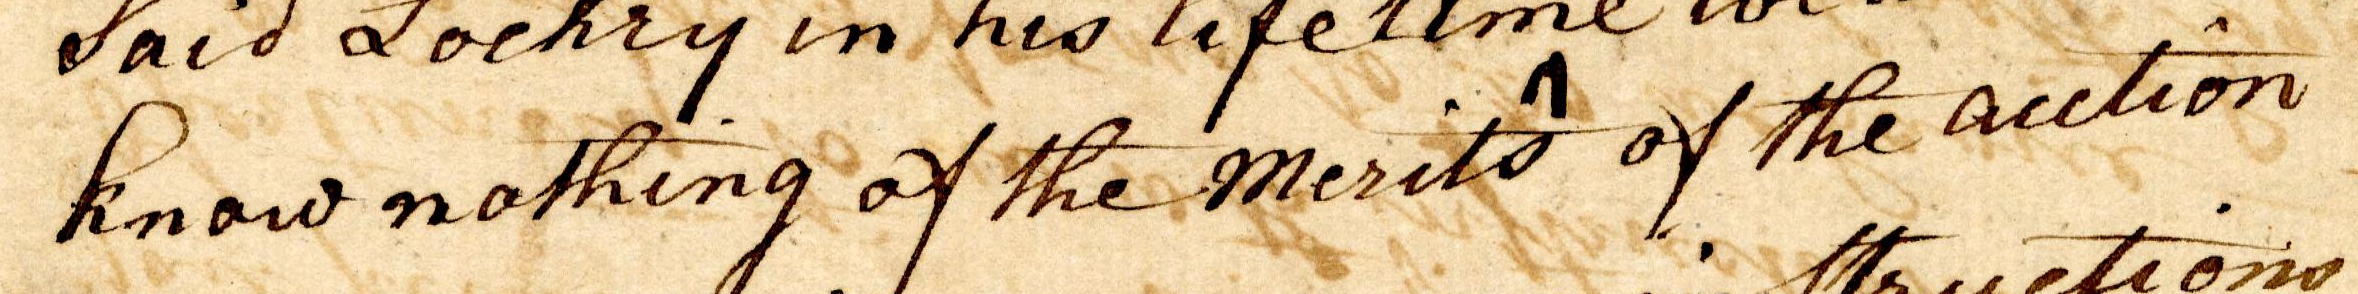know nothing of the merits of the acction
